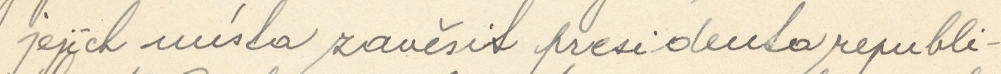jejich místa zavěsit presidenta republi-
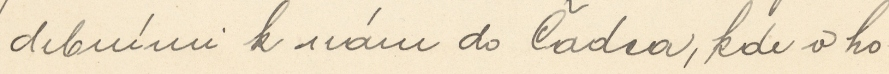debními k nám do Čadca, kde v ho-
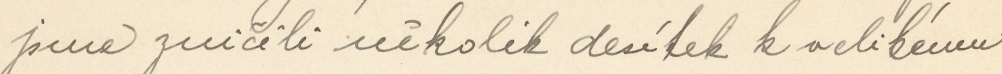jsme zničili několik desítek k velikému
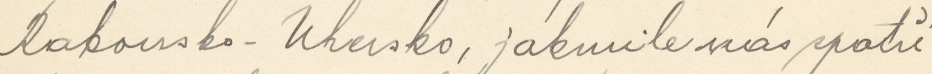Rakousko-Uhersko, jakmile nás spatři-
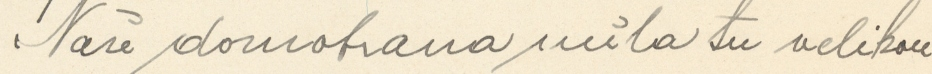Naše domobrana měla tu velikou
